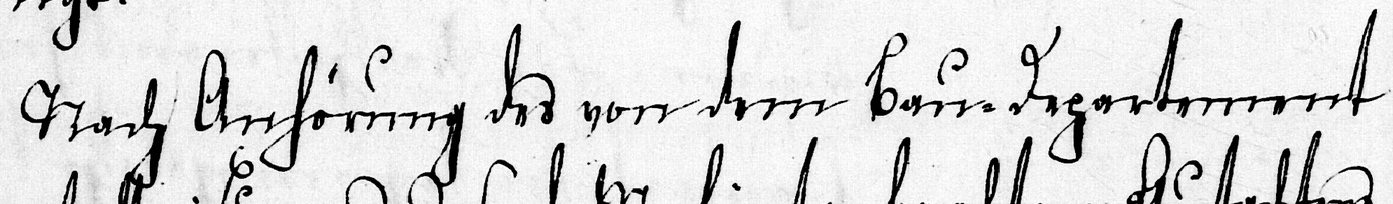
Nach Anhörung des von dem Bau-Departement
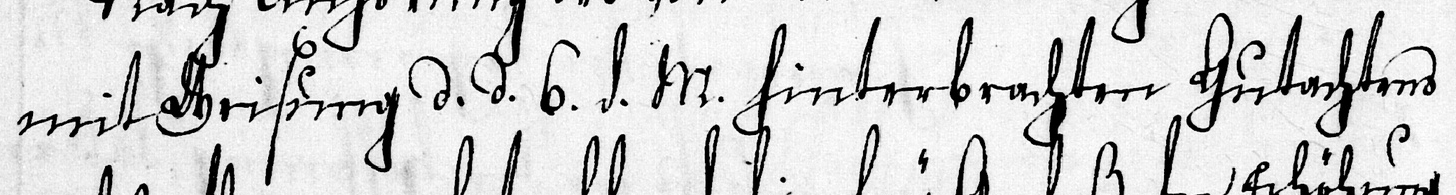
mit Weisung d. d. 6. d. M. hinterbrachten Gutachtens
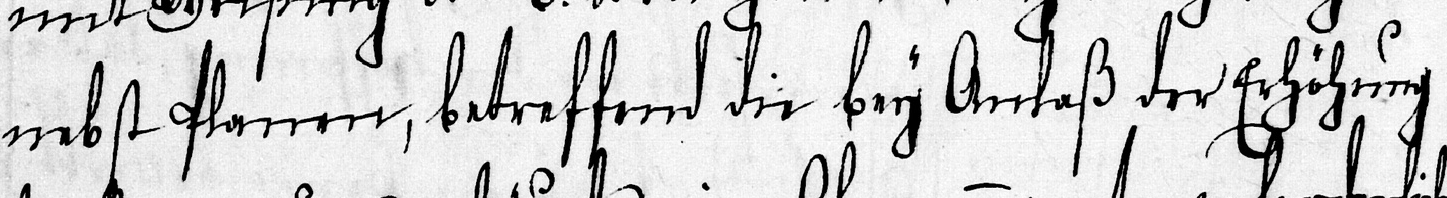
nebst Planen, betreffend die bey Anlaß der Erhöhung
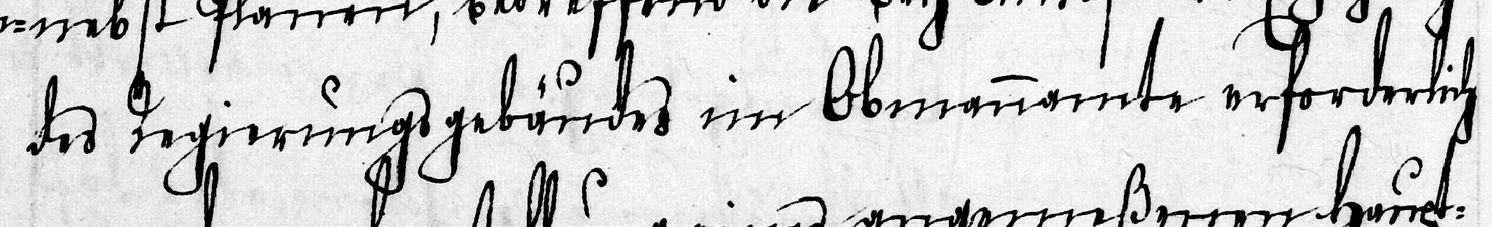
des Regierungsgebäudes im Obmannamte erforderlich
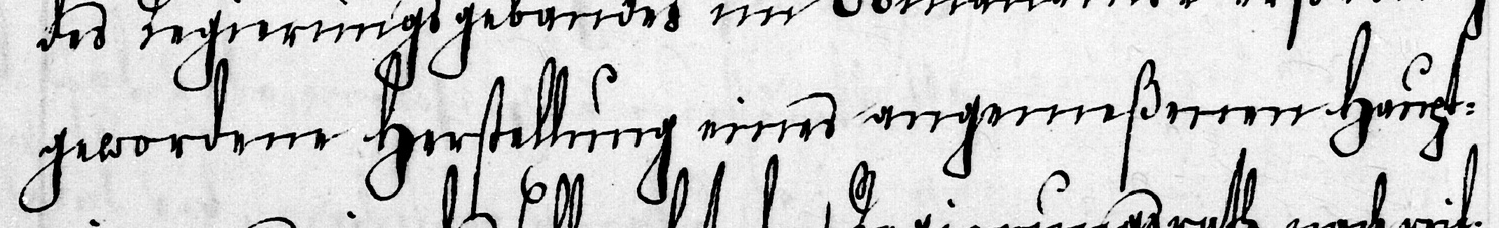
gewordene Herstellung eines angemeßenen Haupt¬
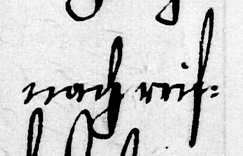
nach reif¬
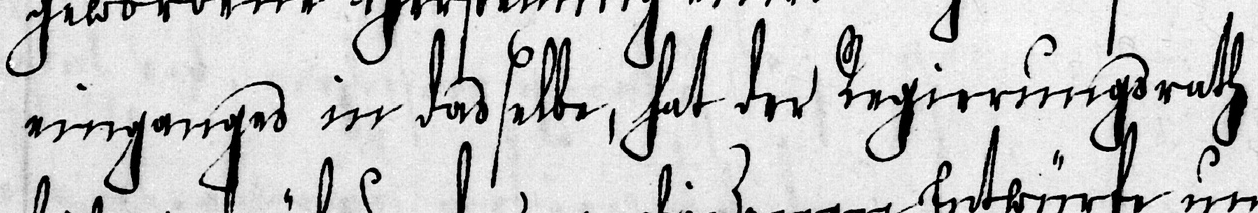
einganges in dasselbe, hat der Regierungsrath
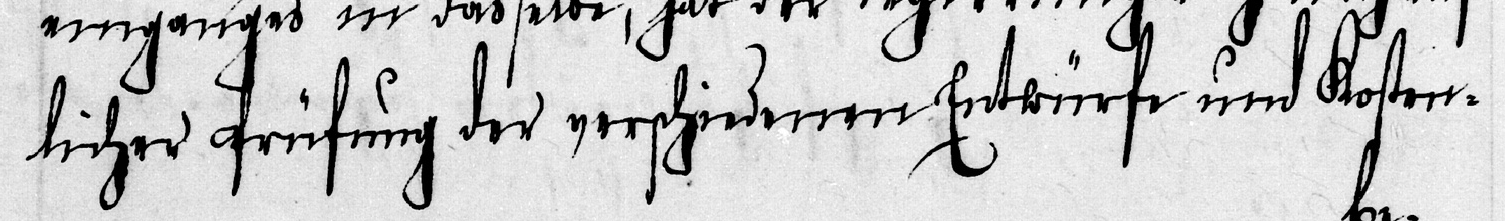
licher Prüfung der verschiedenen Entwürfe und Kosten-
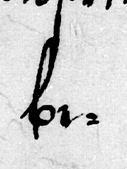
e,
